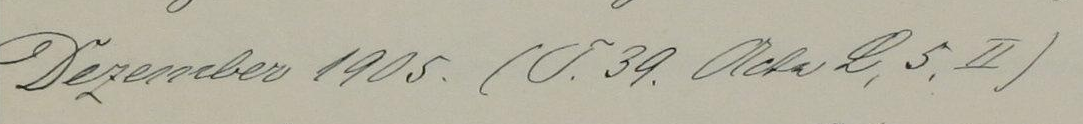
Dezember 1905. (T.39. Acte L.5 II).
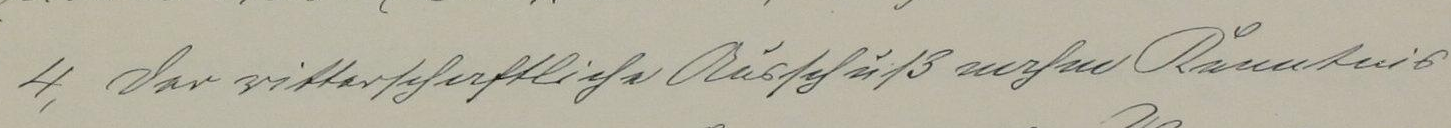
4. Der ritterschaftliche Ausschuß nahm Kenntnis
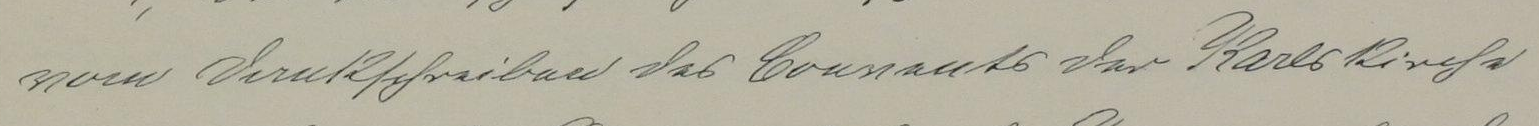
vom Dankschreiben des Convents der Karlskirche
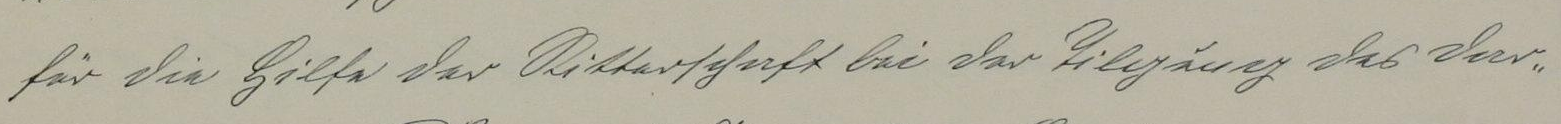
für die Hilfe der Ritterschaft bei der Tilgung des Dar-
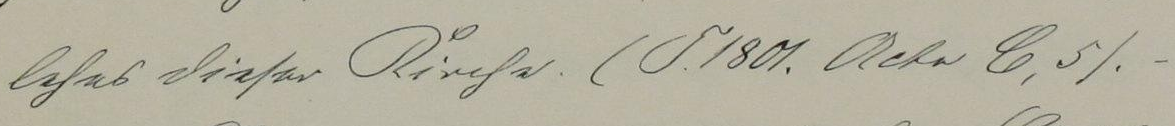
lehns dieser Kirche. (T.1801. Acte C.5).
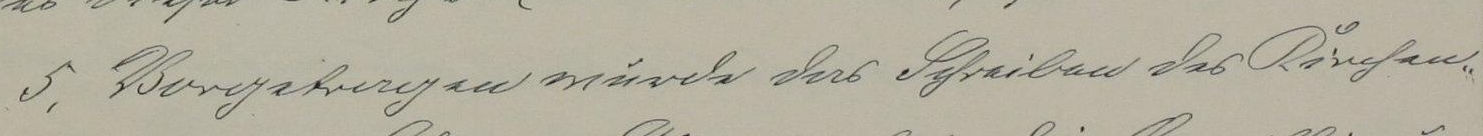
5. Vorgetragen wurde das Schreiben des Kirchen-
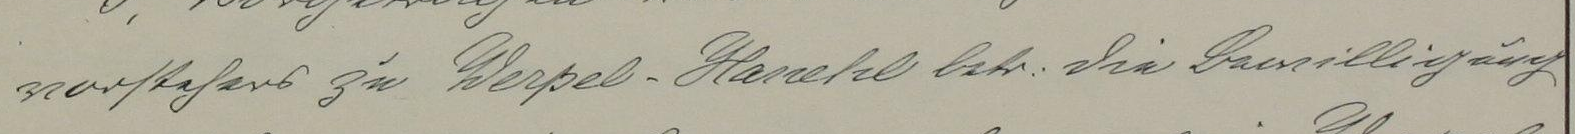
vorstehers zu Werpel-Hanehl betr. die Bewilligung
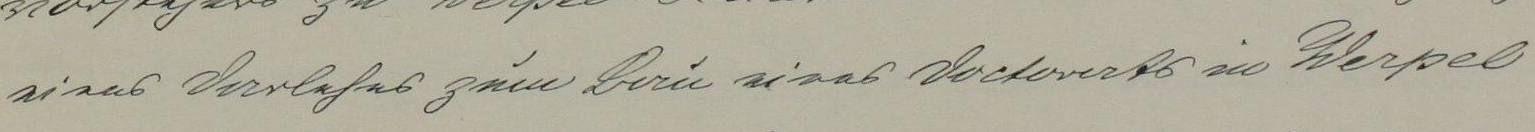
eines Darlehns zum Bau eines Doctorats in Werpel
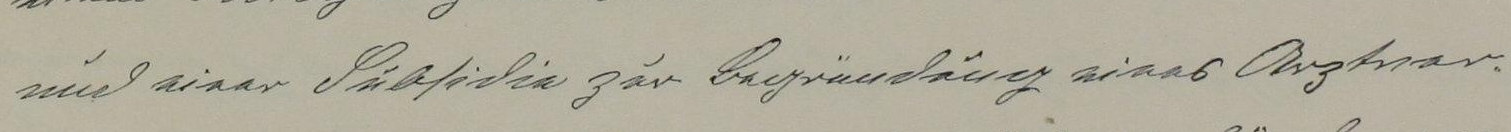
und einer Subsidie zur Begründung eines Arztver-
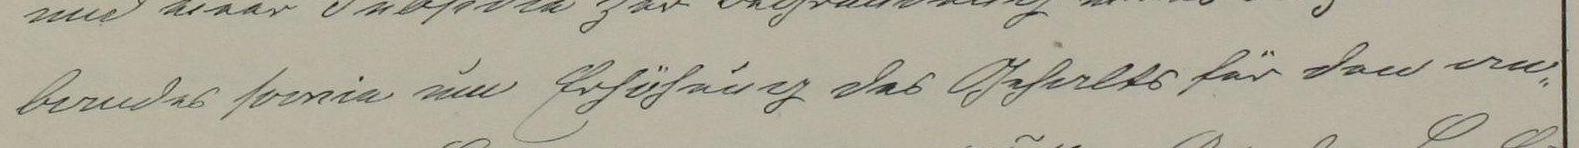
bandes sowie um Erhöhung des Gehalts für den an-
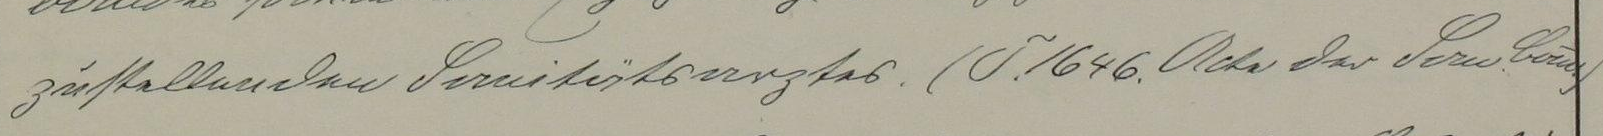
zustellenden Sanitätsarztes (T.1646. Acte der San. Comm.)
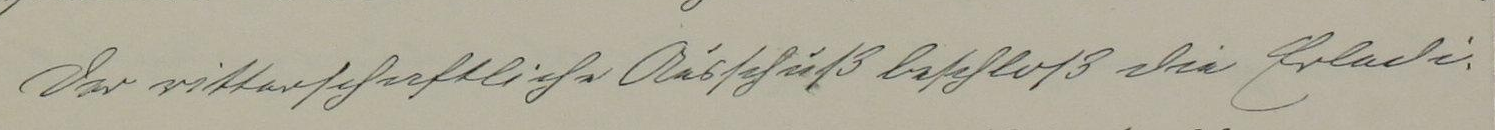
Der ritterschaftliche Ausschuß beschloß die Erledi-
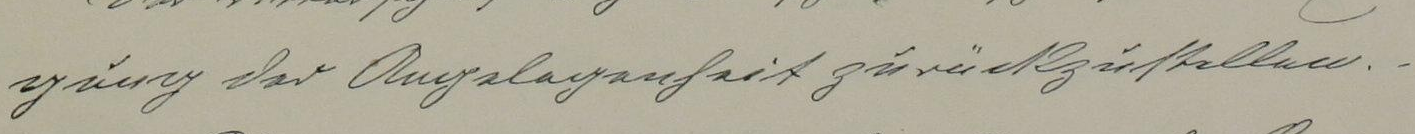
gung der Angelegenheit zurückzustellen.
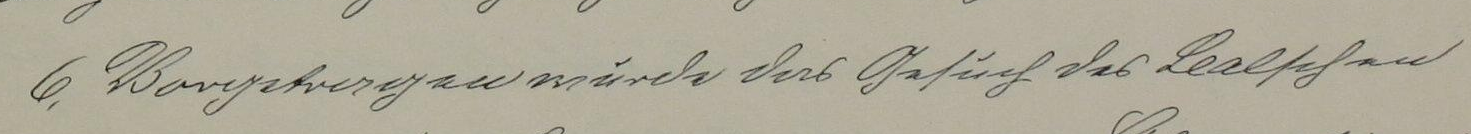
6. Vorgetragen wurde das Gesuch des Lealschen
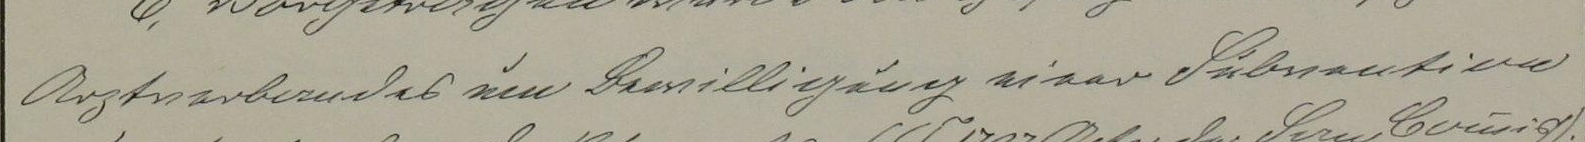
Arztverbandes um Bewilligung einer Subvention
